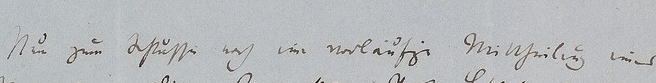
Nun zum Schlusse noch eine vorläufige Mittheilung eines
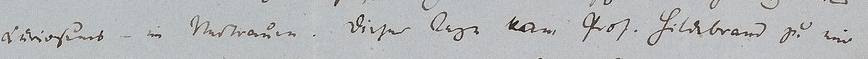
Kuriosums – im Vertrauen. Dieser Tage kam Prof. Hildebrand zu mir
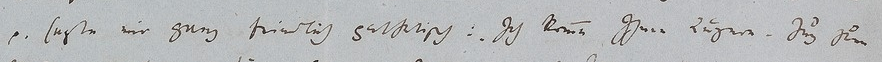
&. sagte mir ganz feierlich pathetisch: «Ich komme Ihnen Luzern–Zug zum
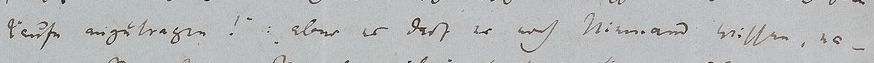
Kaufe anzutragen!»: «aber es darf es noch Niemand wissen, na-
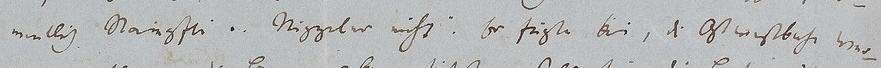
mentlich Stämpfli &. Niggeler nicht». Er fügte bei, die Ostwestbahn wer-
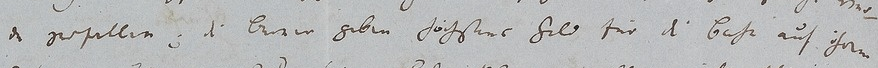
de zerfallen; die Berner geben höchstens Geld für die Bahn auf ihrem
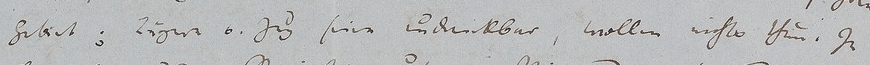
Gebiet; Luzern &. Zug seien undenkbar, wollen nichts thun. In
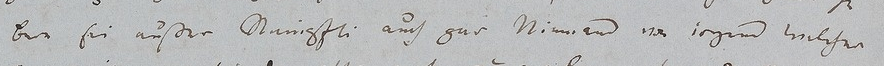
Bern sei außer Stämpfli auch gar Niemand von irgend welcher
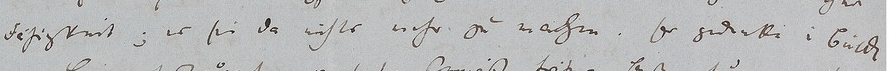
Fähigkeit; es sei da nichts mehr zu machen. Er gedenke in Bälde
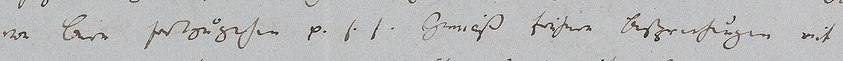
von Bern fortzugehen &. s. f. Gemäß frühern Besprechungen mit
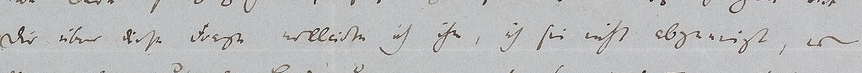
Dir über diese Frage erklärte ich ihm, ich sei nicht abgeneigt, es
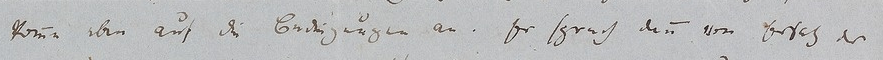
komme eben auf die Bedingungen an. Er sprach dann von Ersatz des
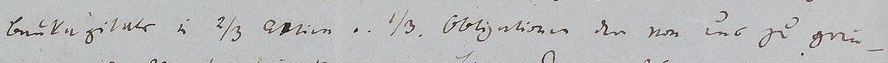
Baukapitals in ⅔ Aktien &. ⅓ Obligationen der von uns zu grün-
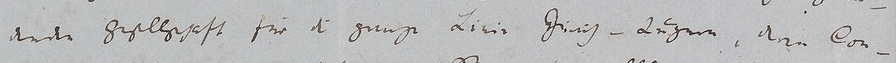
denden Gesellschaft für die ganze Linie Zürich–Luzern, deren Con-
